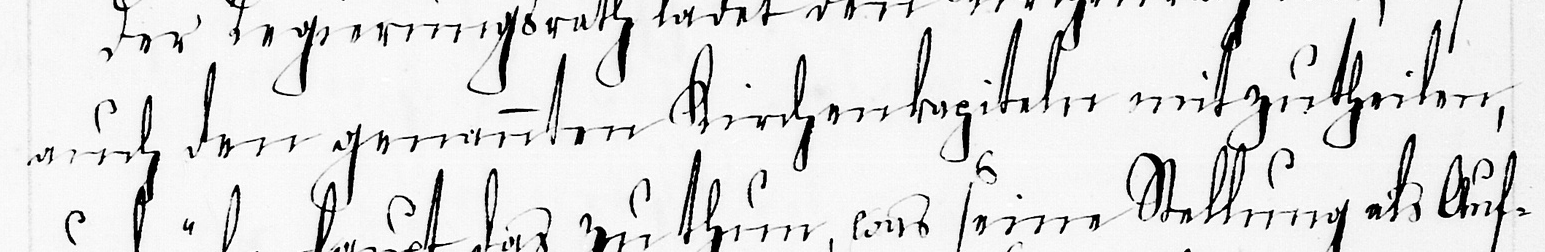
auch den genannten Kirchenkapiteln mitzutheilen,
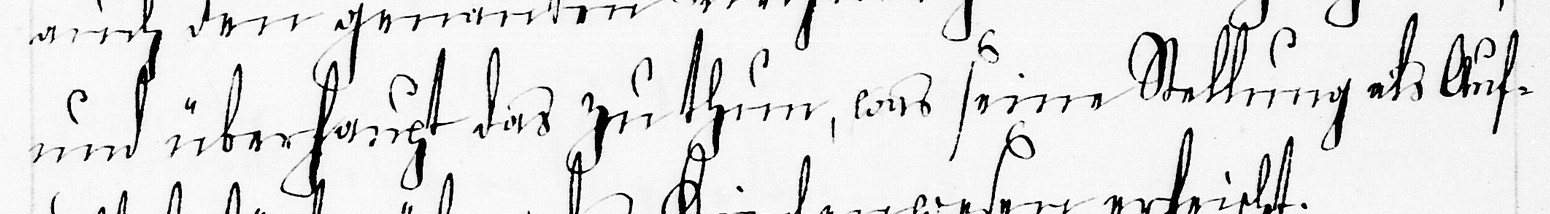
und überhaupt das zu thun, was seine Stellung als Auf¬
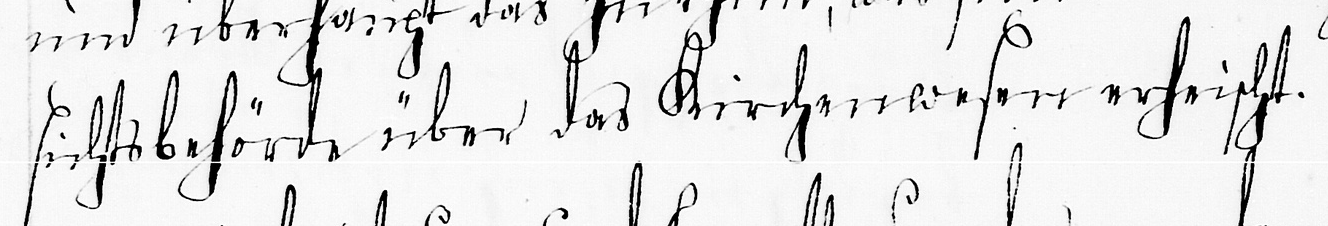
sichtsbehörde über das Kirchenwesen erheischt.
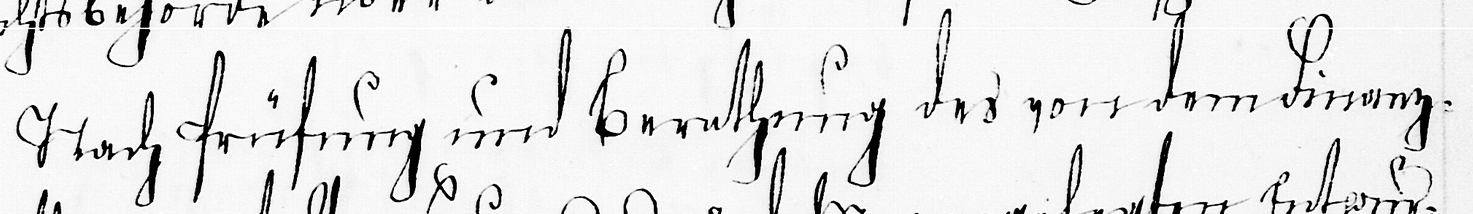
Nach Prüfung und Berathung des von dem Finanz¬
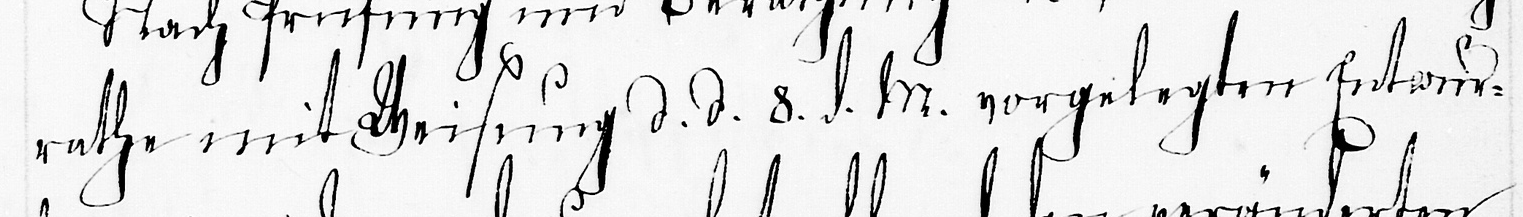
rathe mit Weisung d. d. 8. d. M. vorgelegten Entwur¬
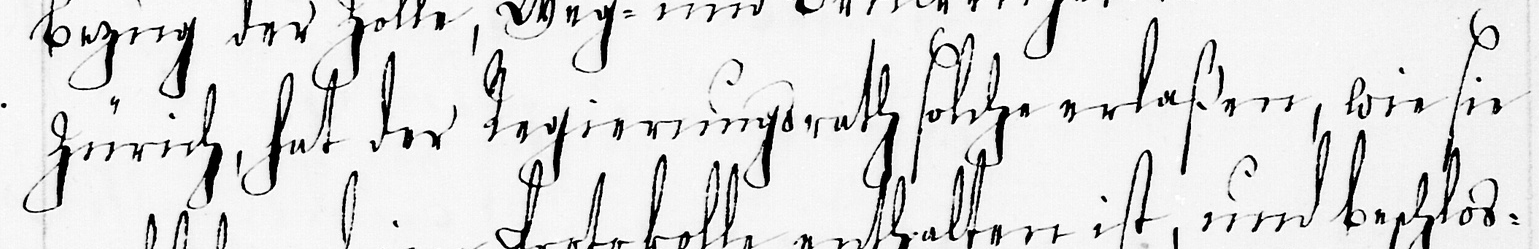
Zürich, hat der Regierungsrath solche erlaßen, wie sie
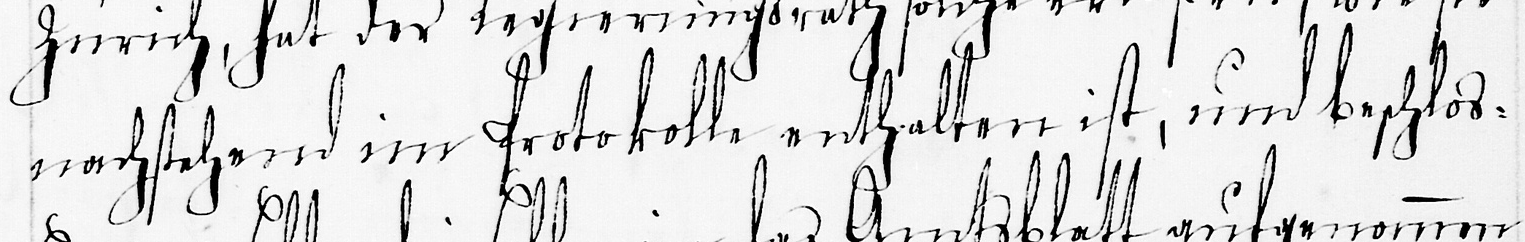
nachstehend im Protokolle enthalten ist, und beschloß¬
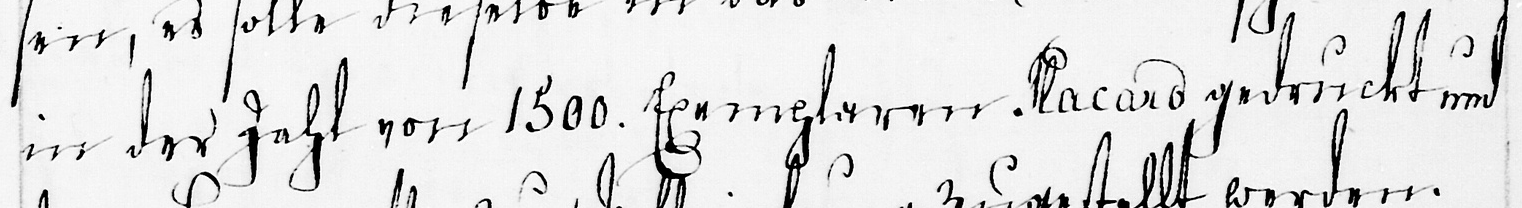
in der Zahl von 1500. Exemplaren Placard gedruckt und
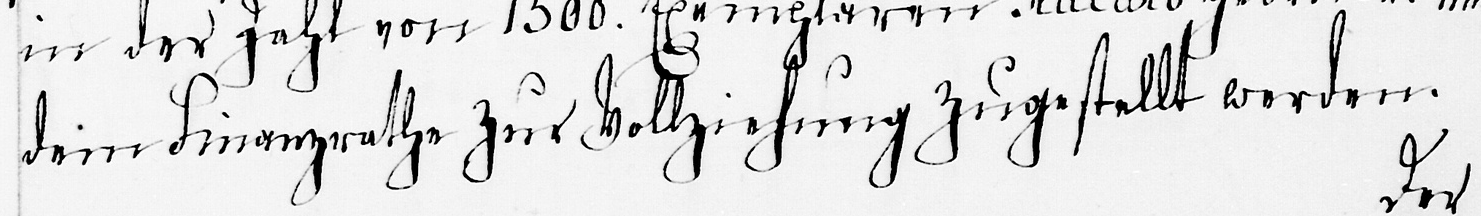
dem Finanzrathe zur Vollziehung zugestellt werden.
